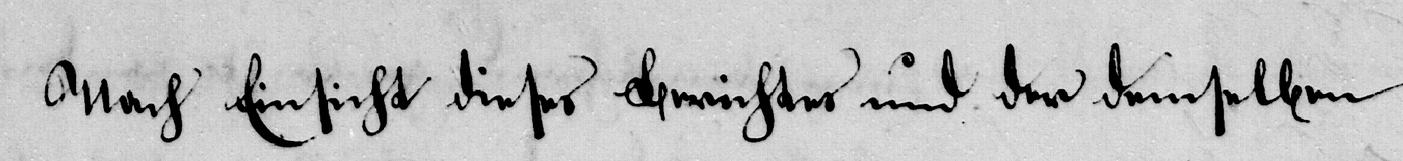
Nach Einsicht dieses Berichtes und der demselben
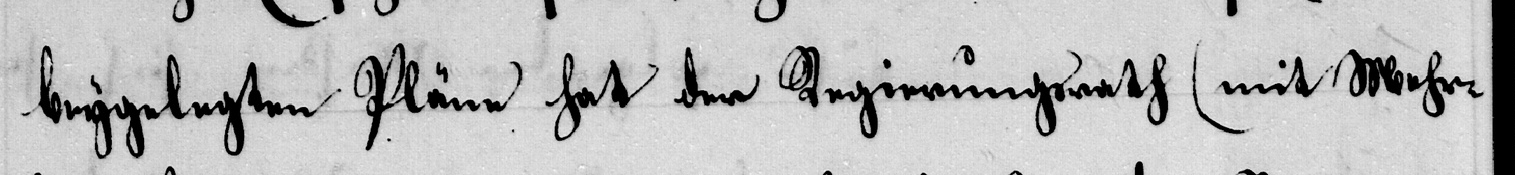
beygelegten Pläne hat der Regierungsrath (mit Mehr¬
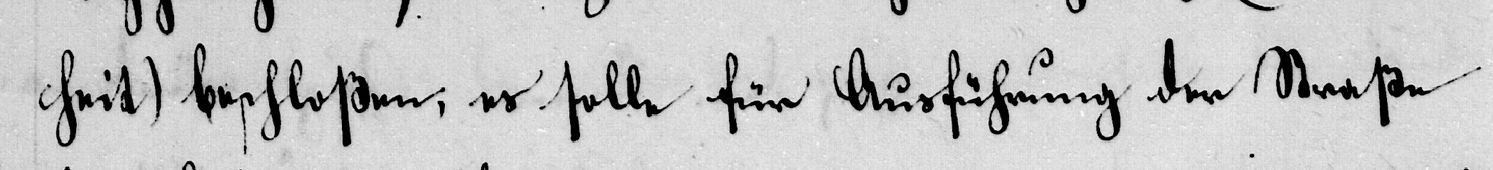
heit) beschloßen, es solle für Ausführung der Straße
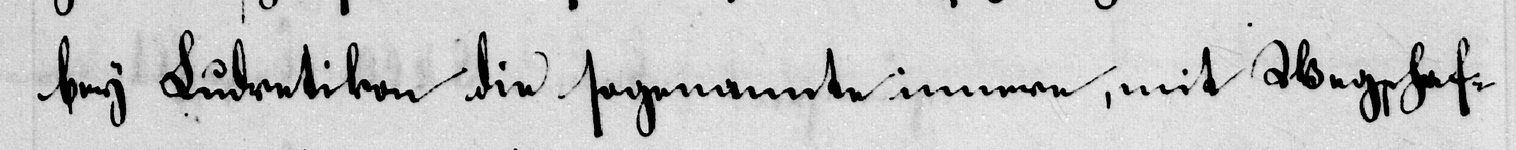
bey Ludretikon die sogenannte innere, mit Wegschaf¬
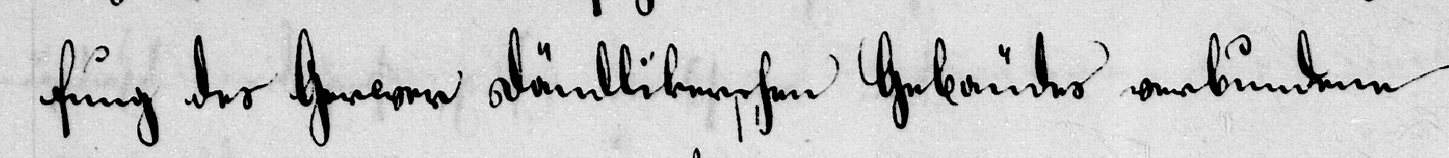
fung des Gerwer Dändlikerschen Gebäudes verbundene
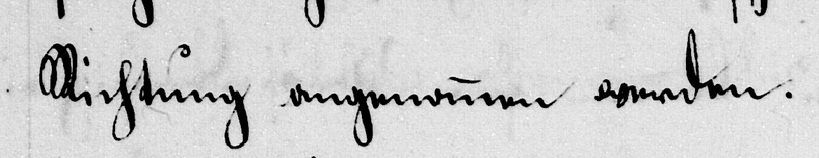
Richtung angenommen werden.
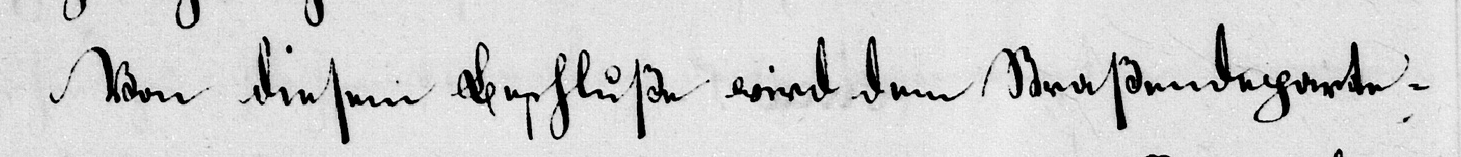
Von diesem Beschluße wird dem Straßendeparte¬
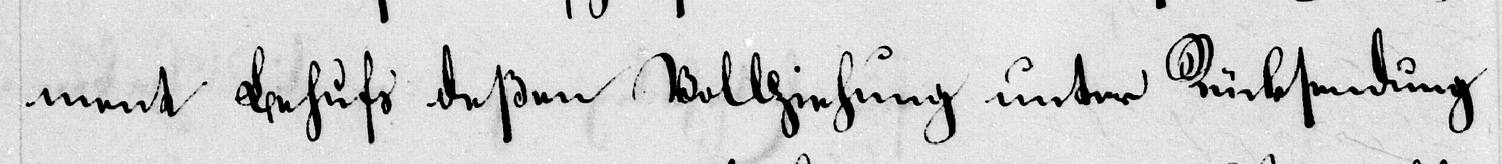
ment Behufs deβen Vollziehung unter Rücksendung
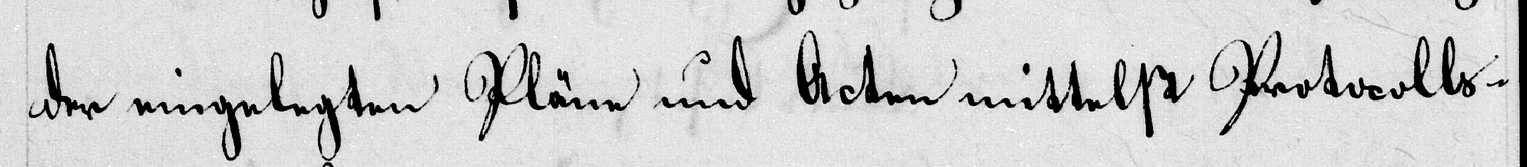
der eingelegten Pläne und Acten mittelst Protocolls¬
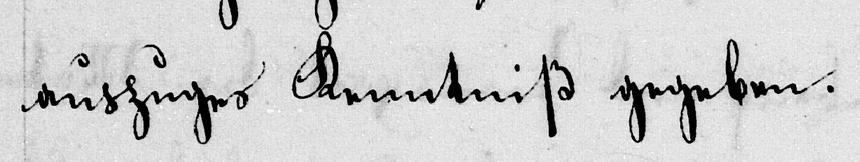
auszuges Kenntniß gegeben.
